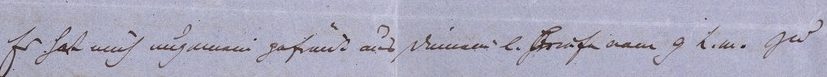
Es hat mich ungemein gefreut aus Deinem l. Briefe vom 9 h. m. zu
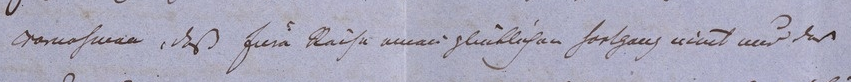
vernehmen, daß Eure Reise einen glücklichen Fortgang nimmt und das
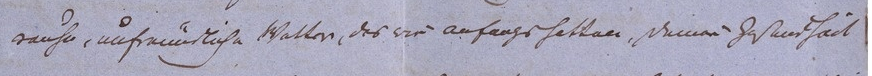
rauhe, unfreundliche Wetter, das wir anfangs hatten, Deiner Gesundheit
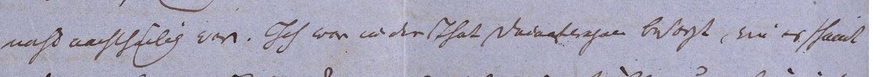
nicht nachtheilig war. Ich war in der That Deinetwegen besorgt, wie es scheint
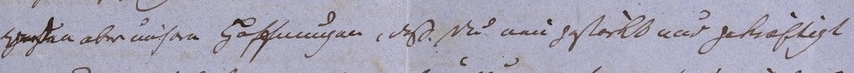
werden aber unsere Hoffnungen, daß Du neu gestärkt und gekräftigt
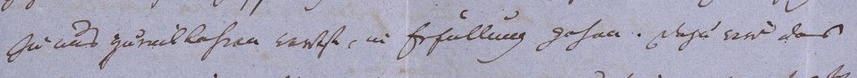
zu uns zurückkehren werdest, in Erfüllung gehen. Dazu wird das
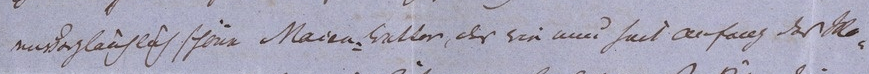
unvergleichlich schöne Maien-Wetter, das wir nun seit Anfang des Mo-
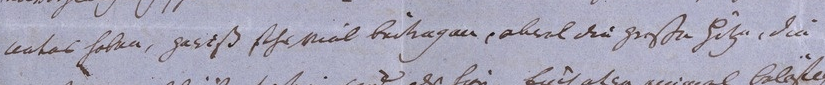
nates haben, gewiß sehr viel beitragen, obwol die große Hitze, die
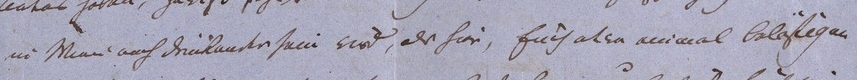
in Wien noch drückender sein wird, als hier, Euch etwa einmal belästigen
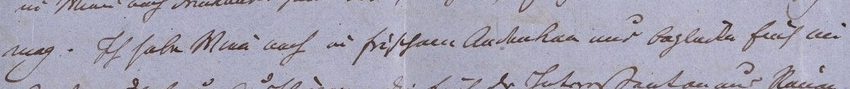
mag. Ich habe Wien noch in frischem Andenken und begleite Euch im
